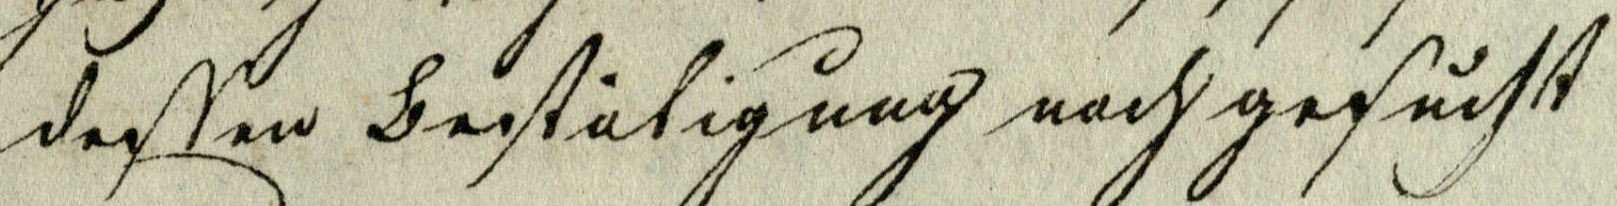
dessen Bestätigung nachgesucht
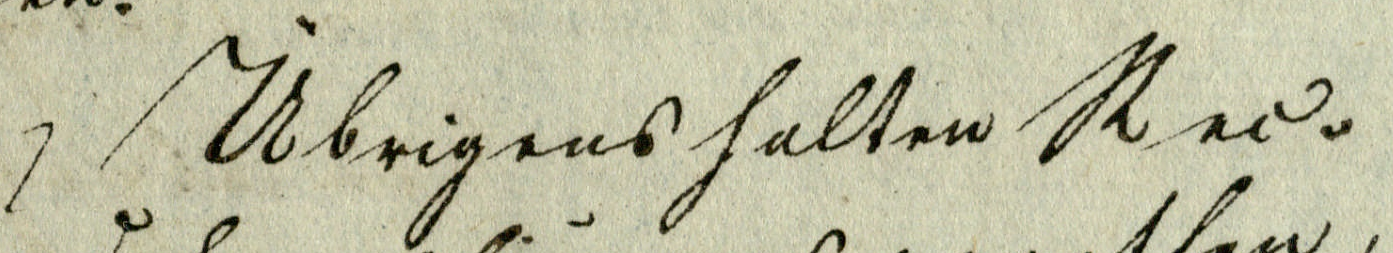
Übrigens halten Rec¬
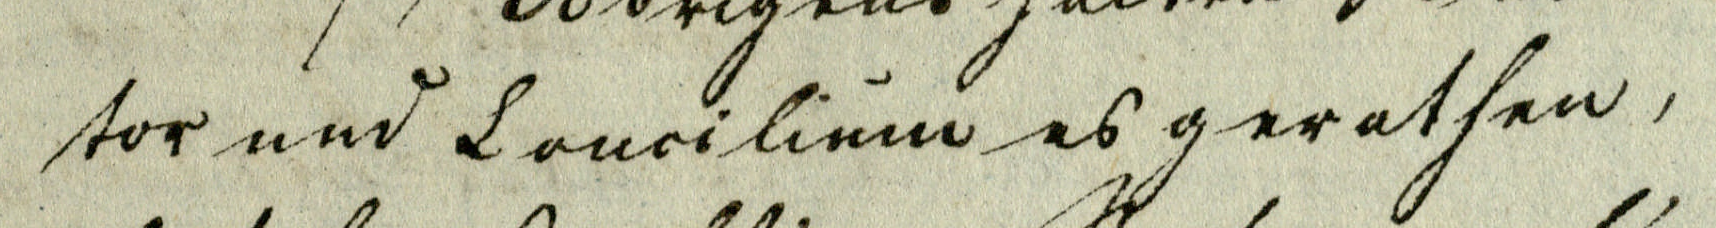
tor und Concilium es gerathen,
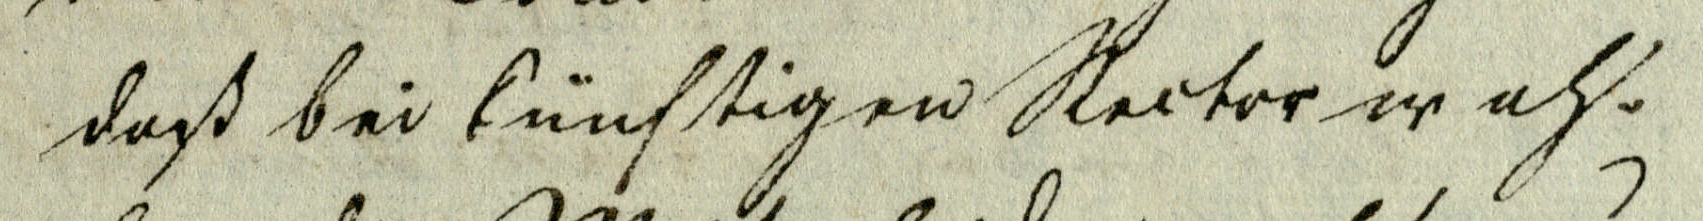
daß bei künftigen Rectorwah¬
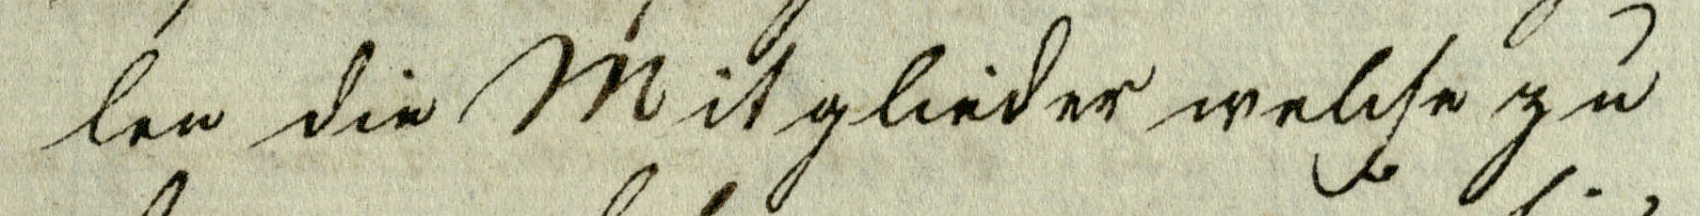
len die Mitglieder welche zu
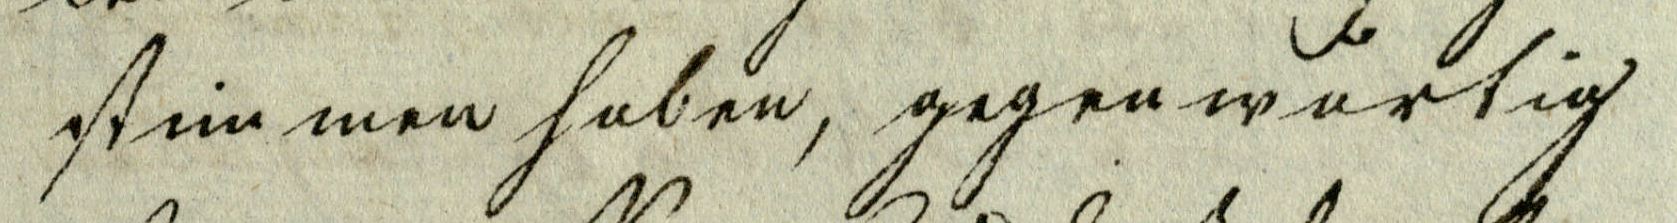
stimmen haben, gegenwärtig
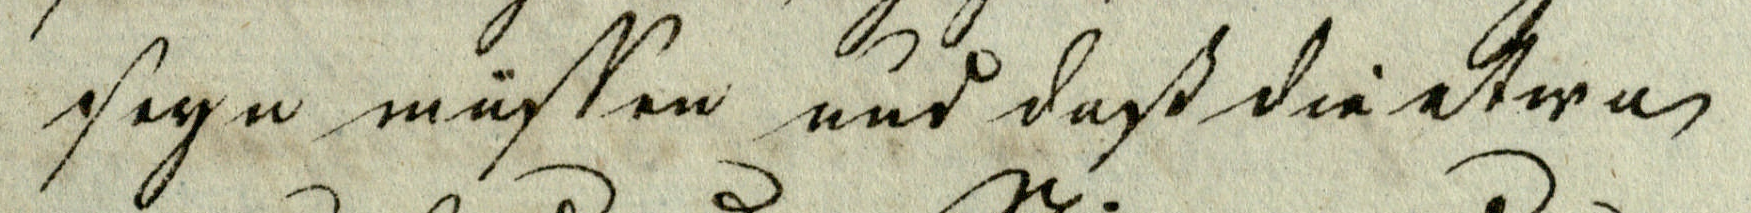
seyn müssen und daß die etwa
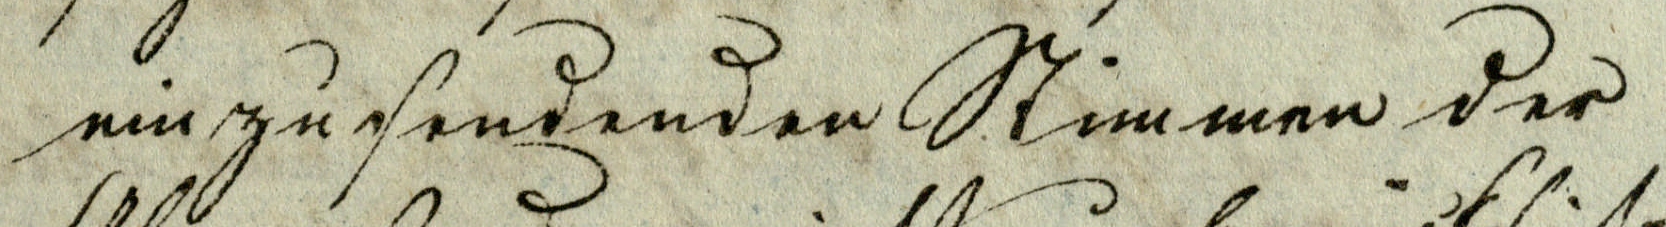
einzusendenden Stimmen der
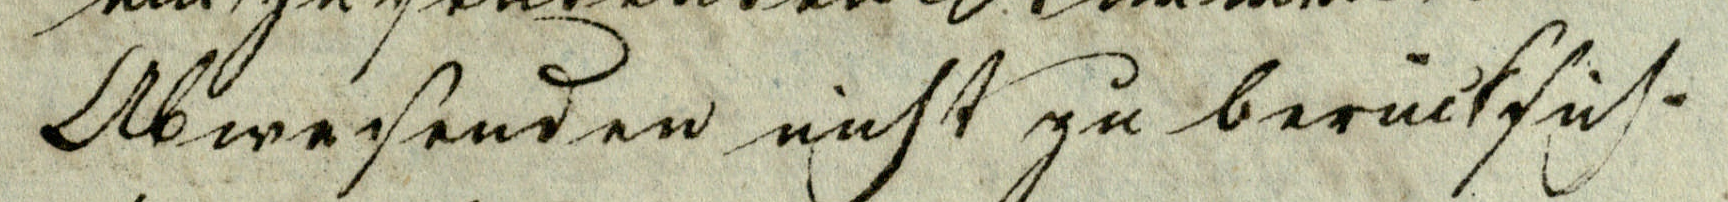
Abwesenden nicht zu berücksich¬
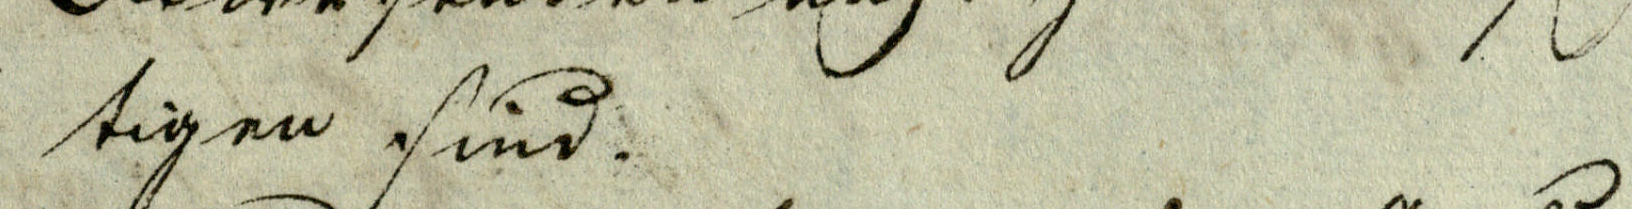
tigen sind.
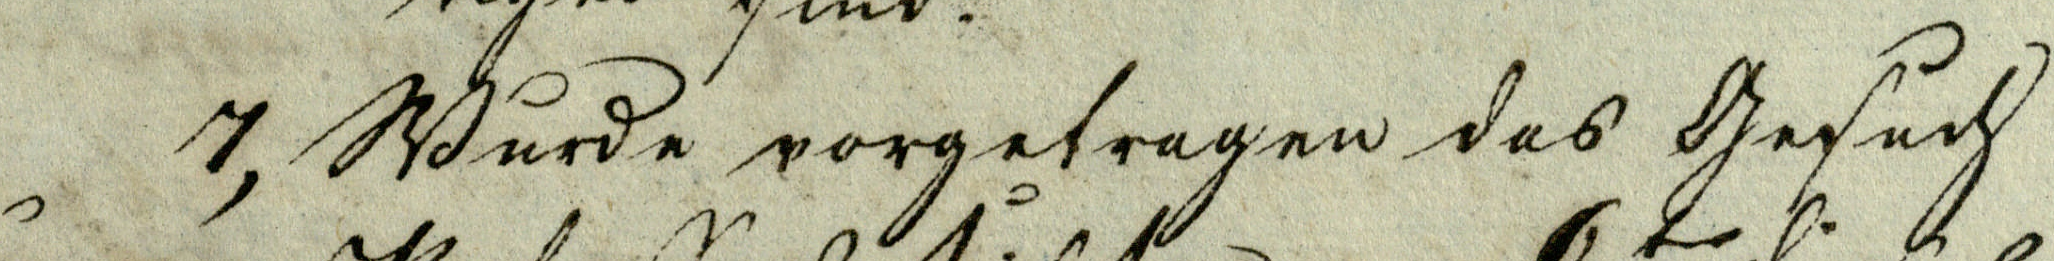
7, Wurde vorgetragen das Gesuch
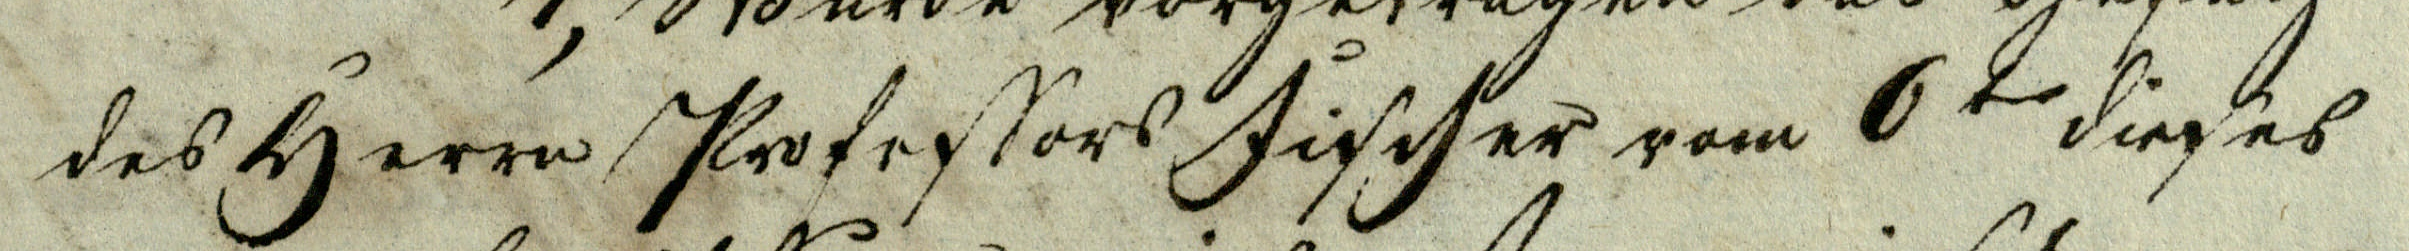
des Herrn Professors Fischer vom 6ten dieses
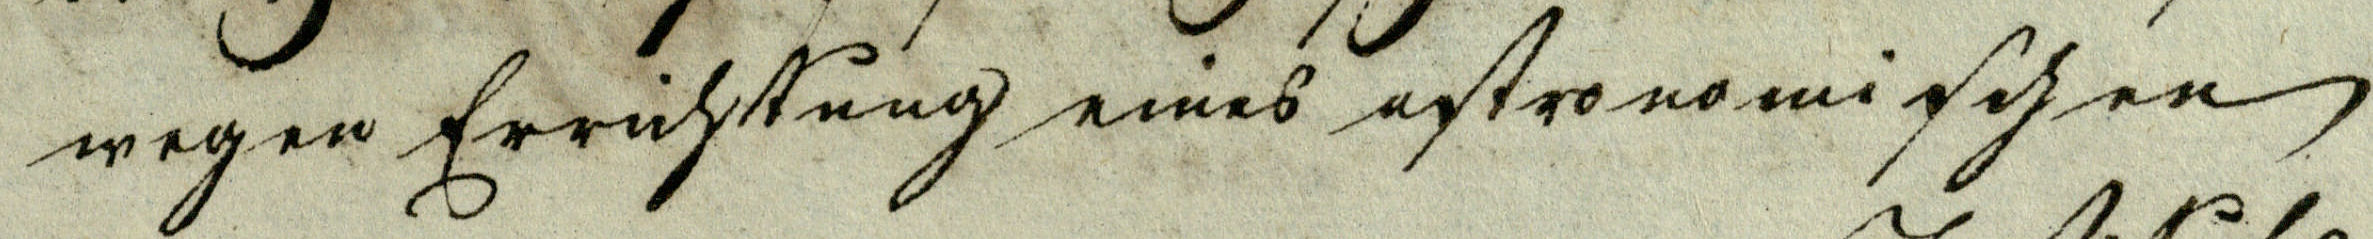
wegen Errichtung eines astronomischen
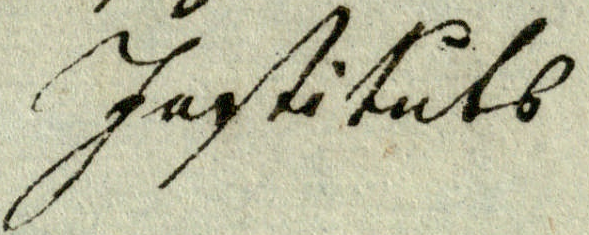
Instituts
